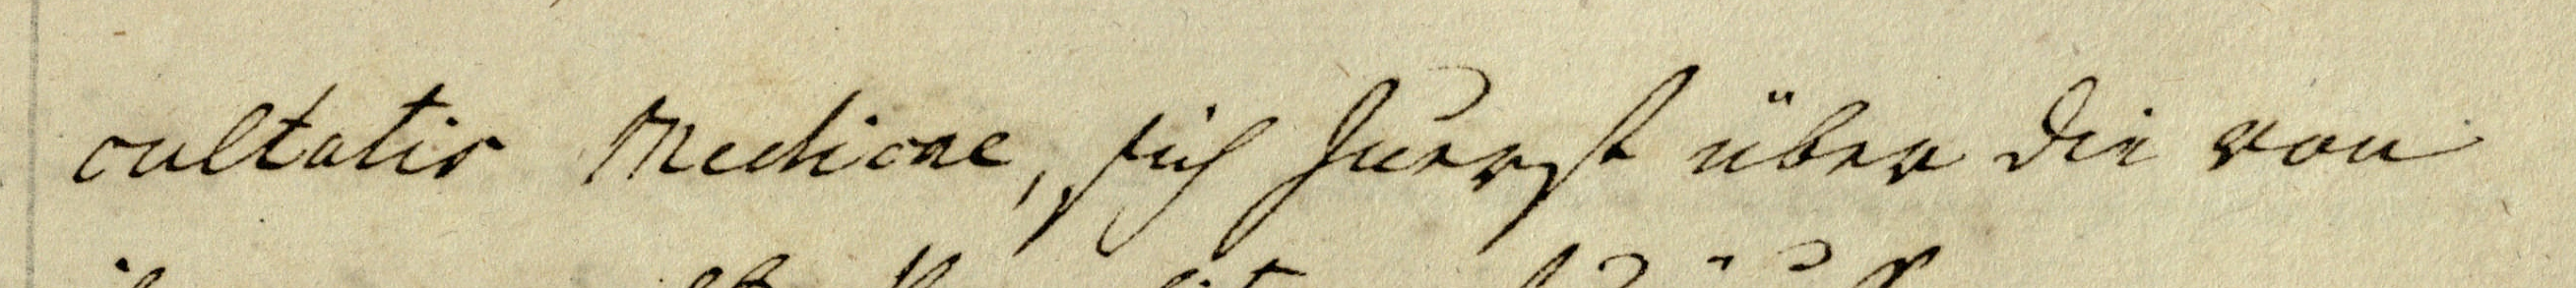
cultatis Medicae, sich zuerst über die von
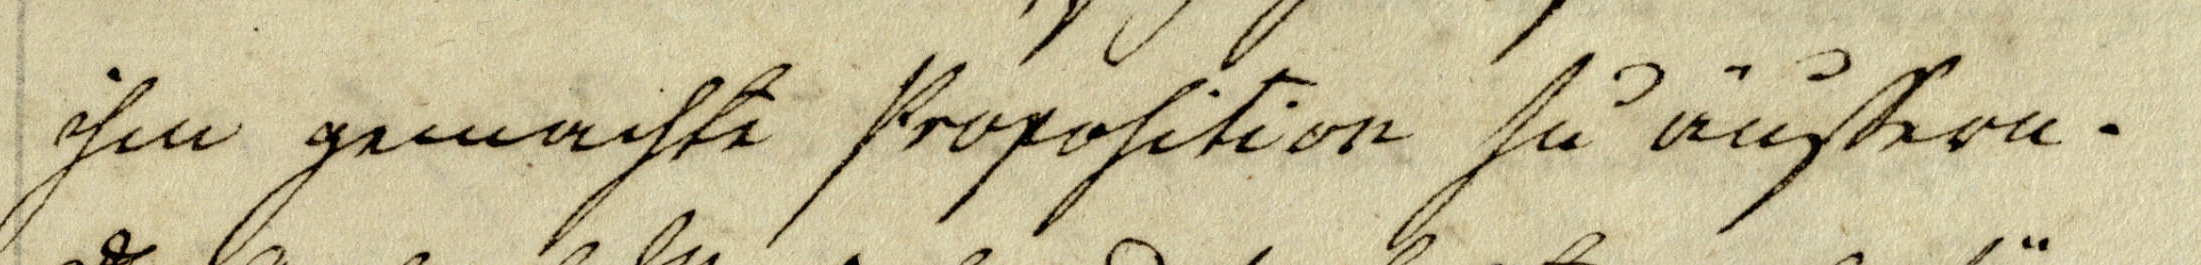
ihm gemachte Proposition zu äussern.
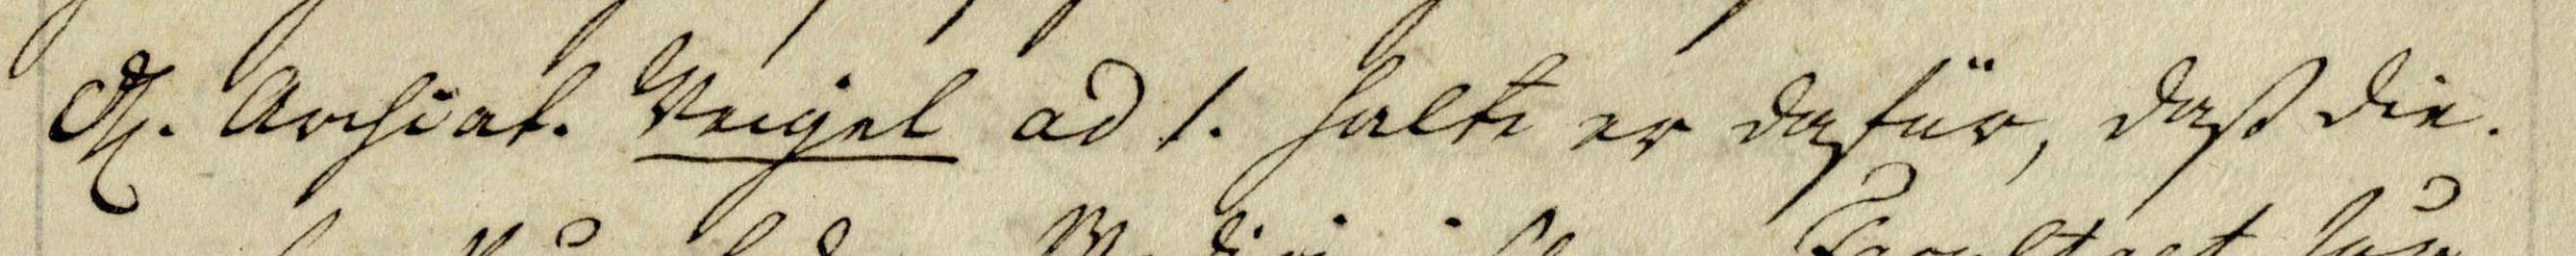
dh. Archiat. Weigel ad 1. halte er dafür, daß die
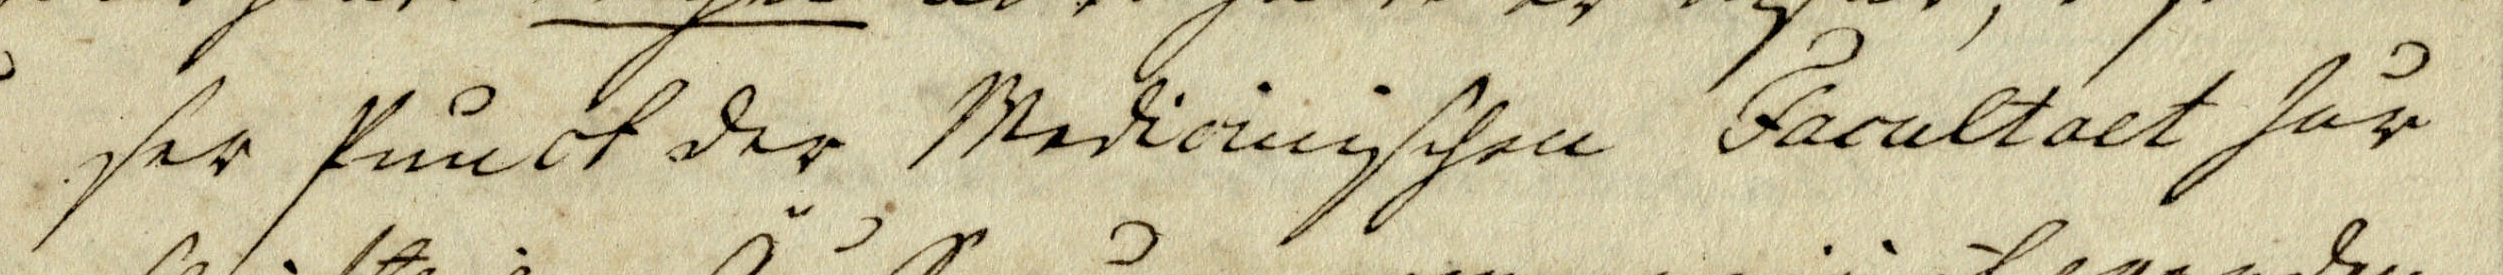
ser Punct der Medicinischen Facultaet zur
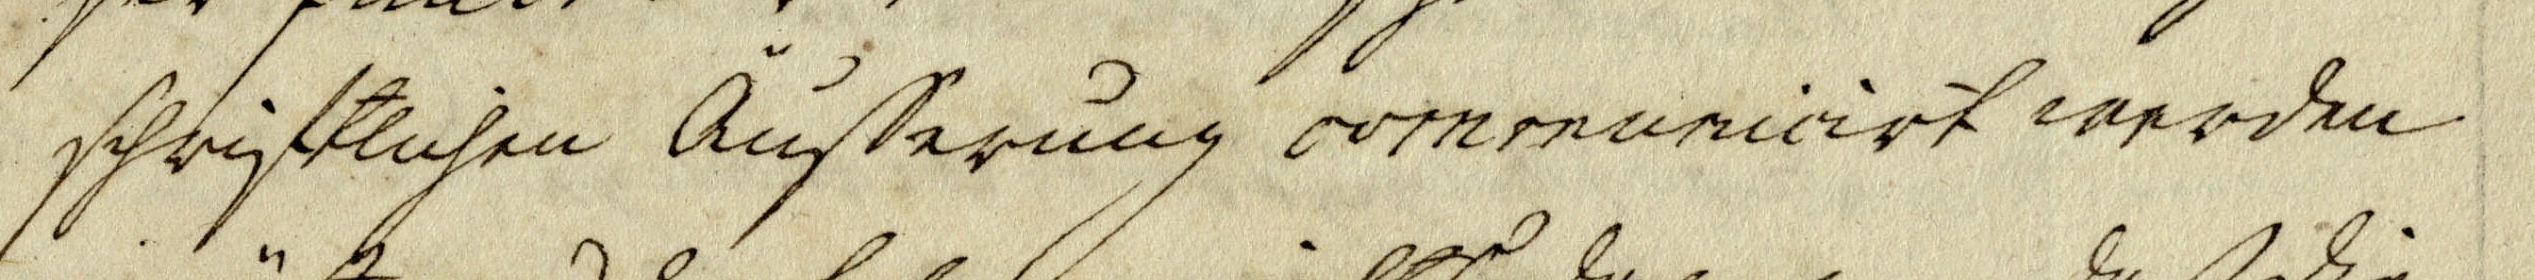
schriftlichen Äusserung communicirt werden
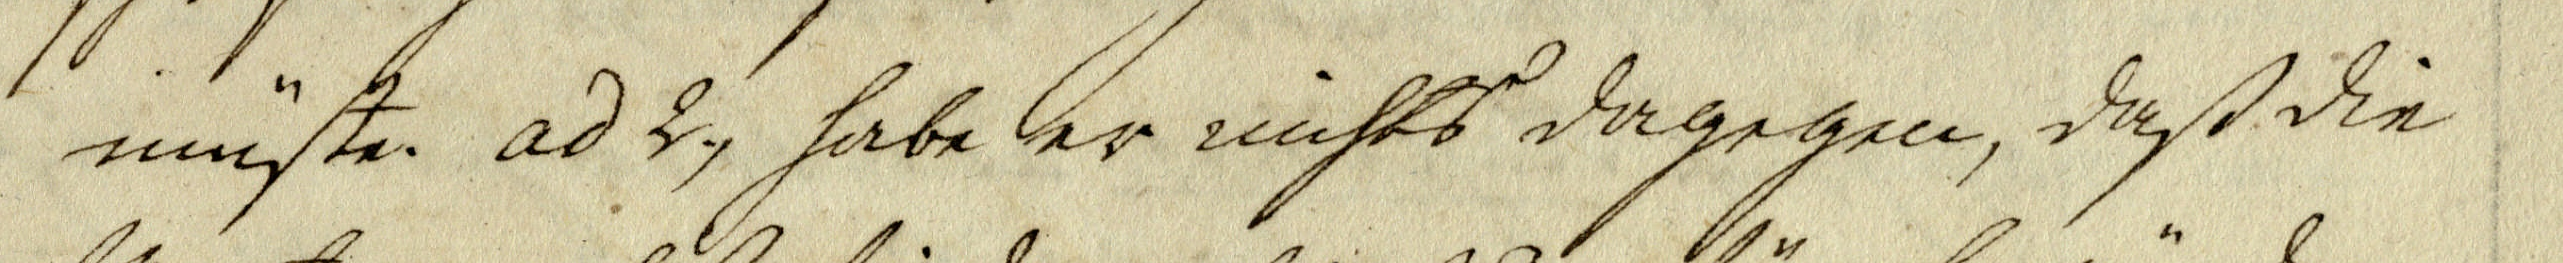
müßte. ad 2., habe er nichts dagegen, daß die
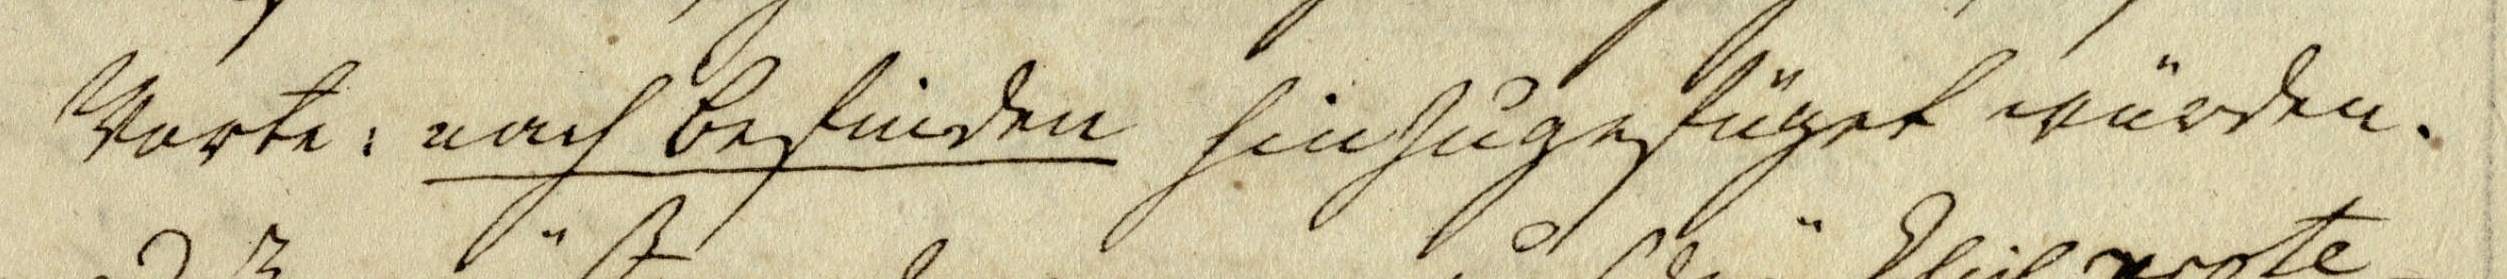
Worte: nach befinden hinzugefüget würden.
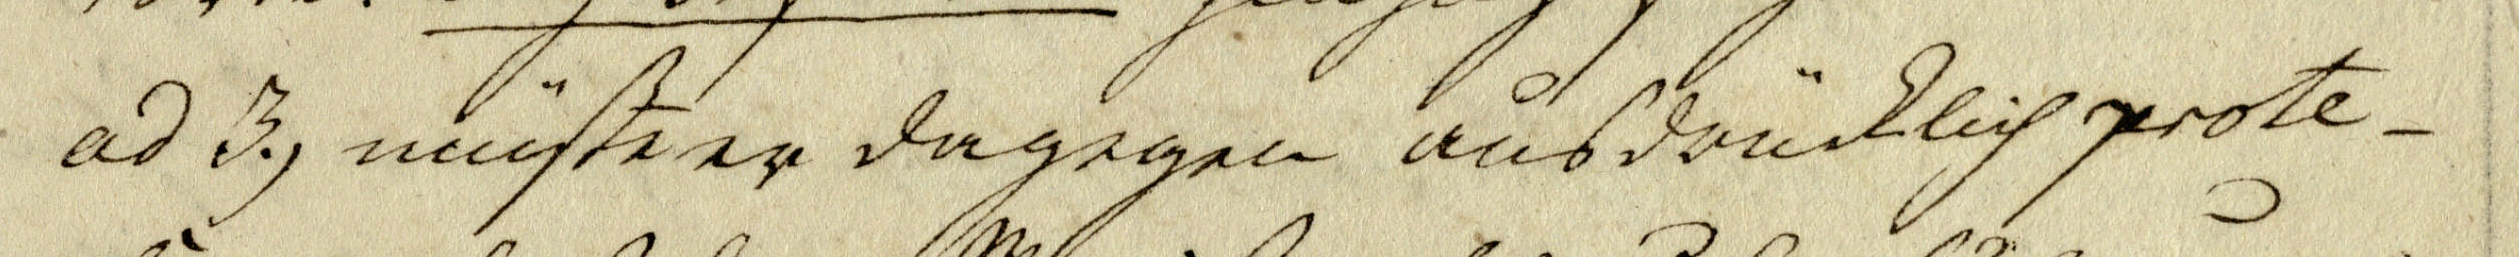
ad 3., müsste er dagegen ausdrücklich prote¬
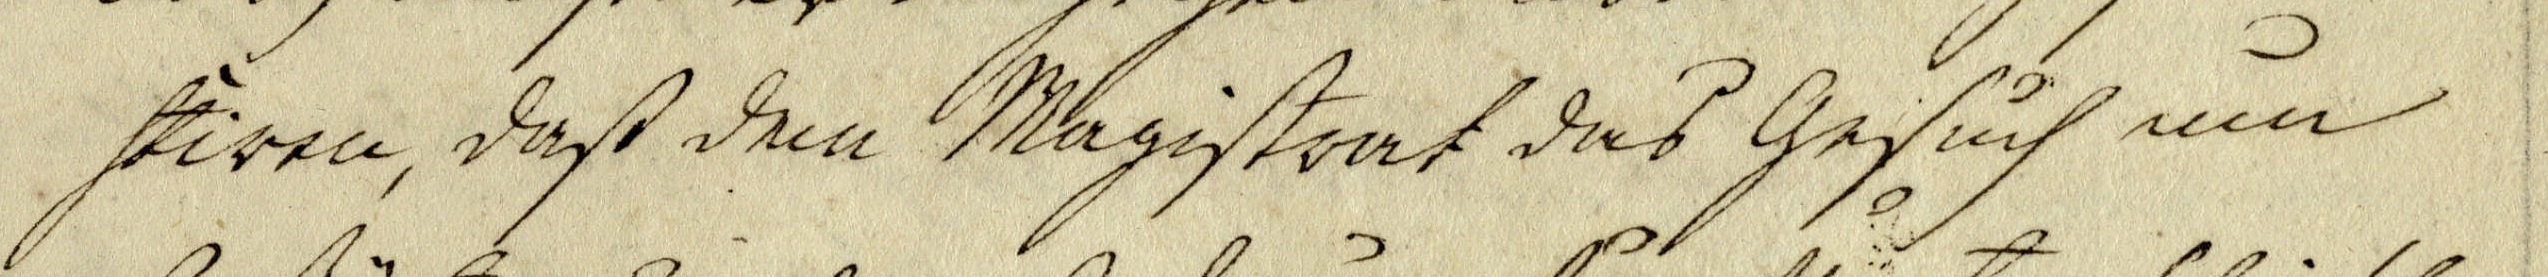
stiren, daß dem Magistrat das Gesuch um
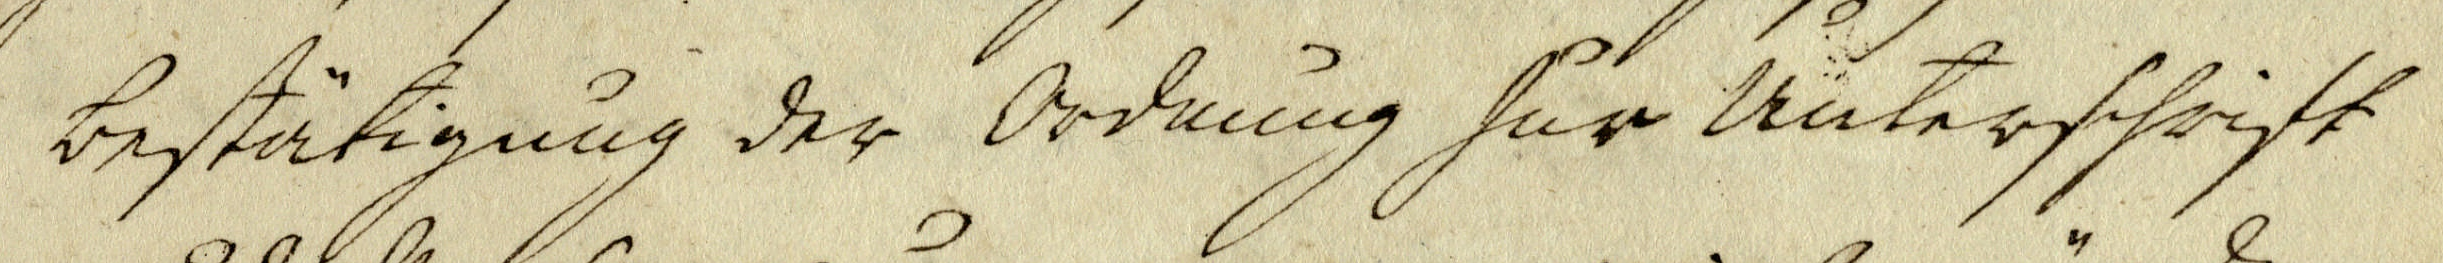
Bestätigung der Ordnung zur Unterschrift
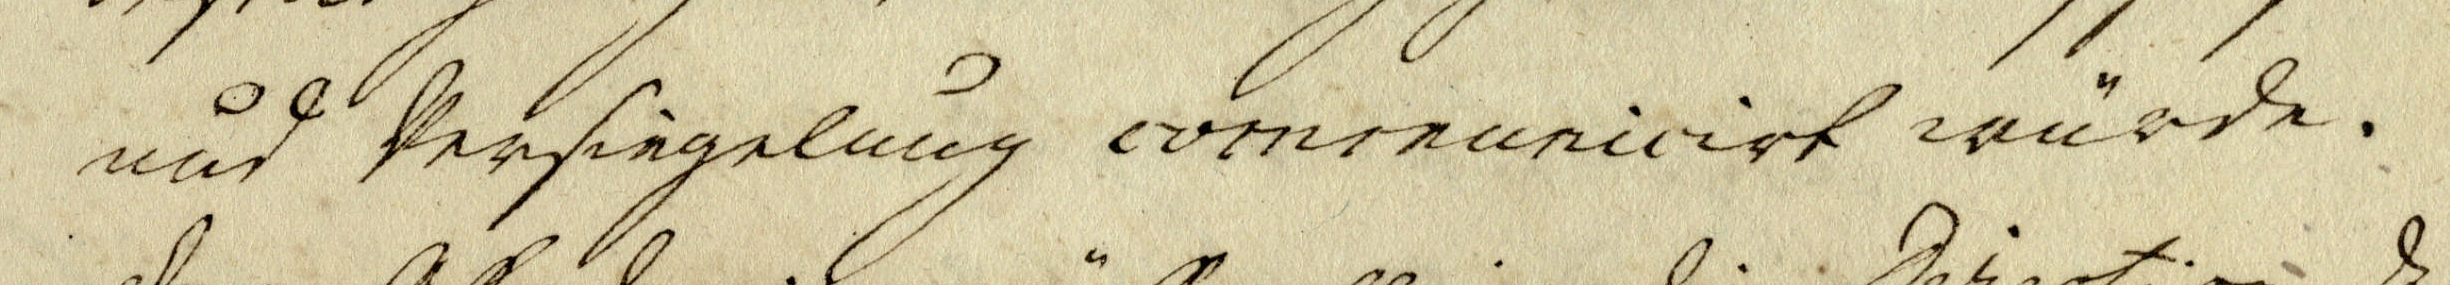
und Versiegelung communicirt würde.
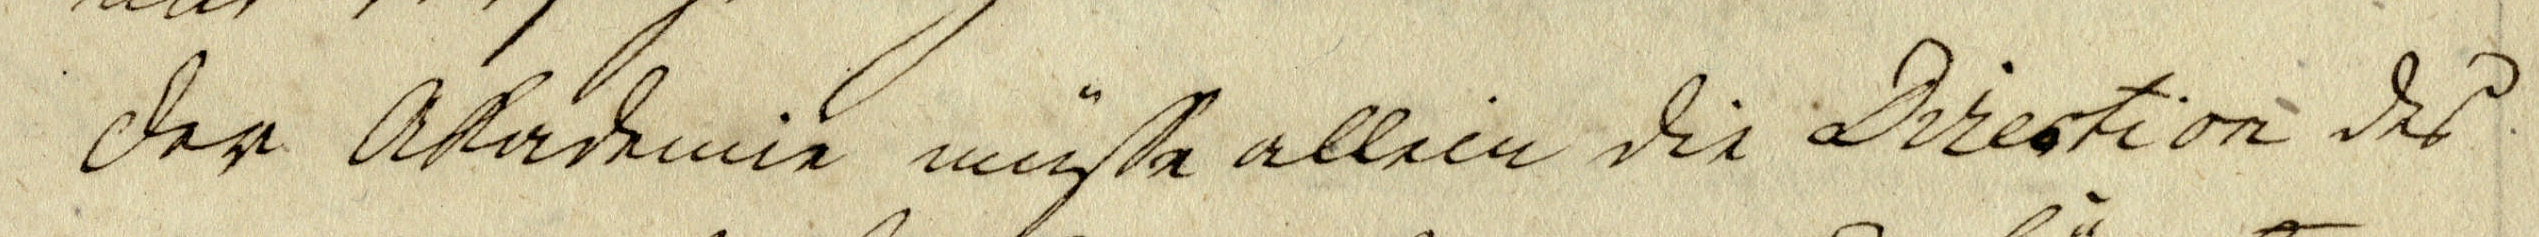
Der Akademie müsse allein die Direction des
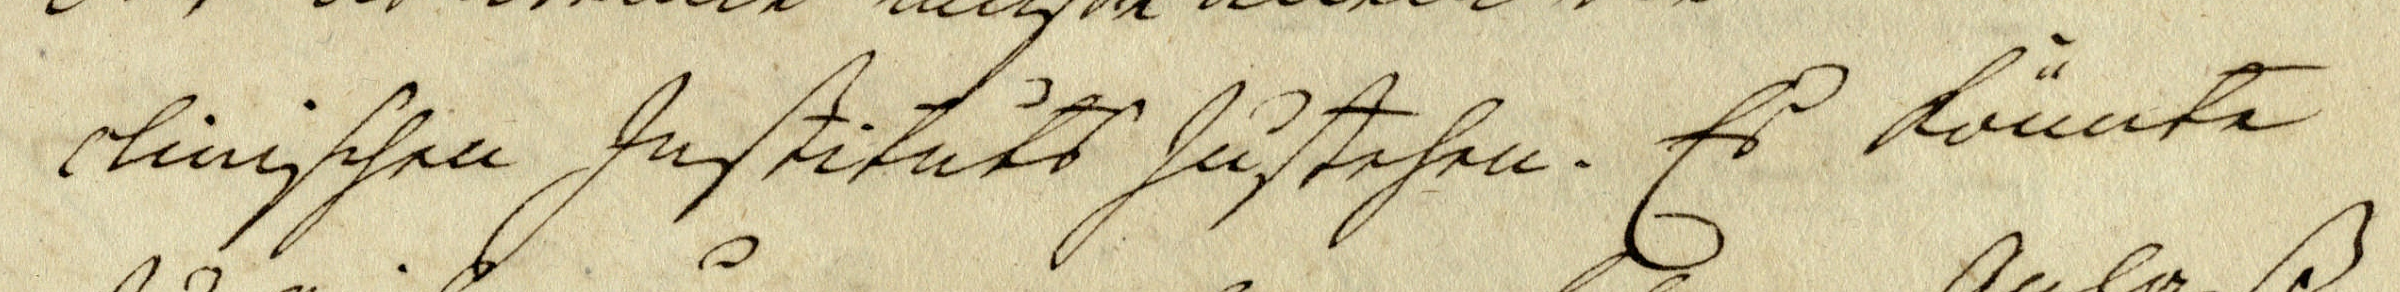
clinischen Instituts zustehen. Es könnte
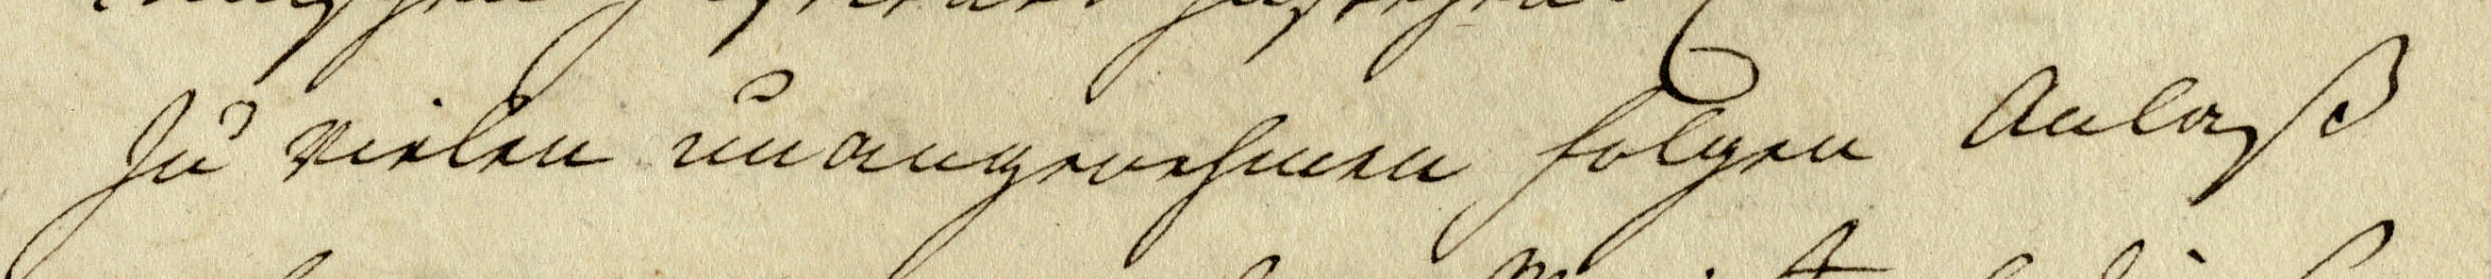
zu vielen unangenehmen Folgen Anlaß
